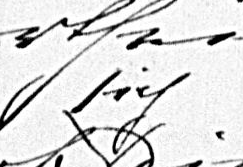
sich
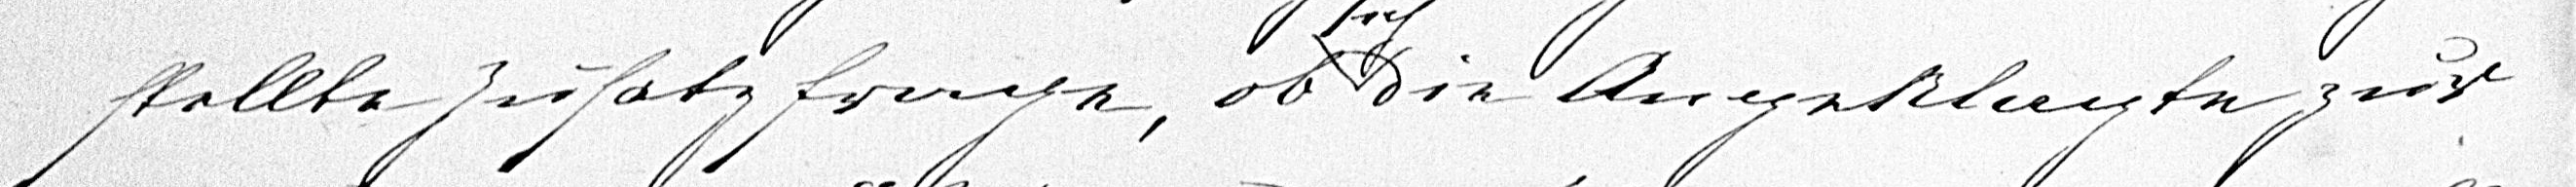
stellte Zusatz frage, ob die Angeklagte zur
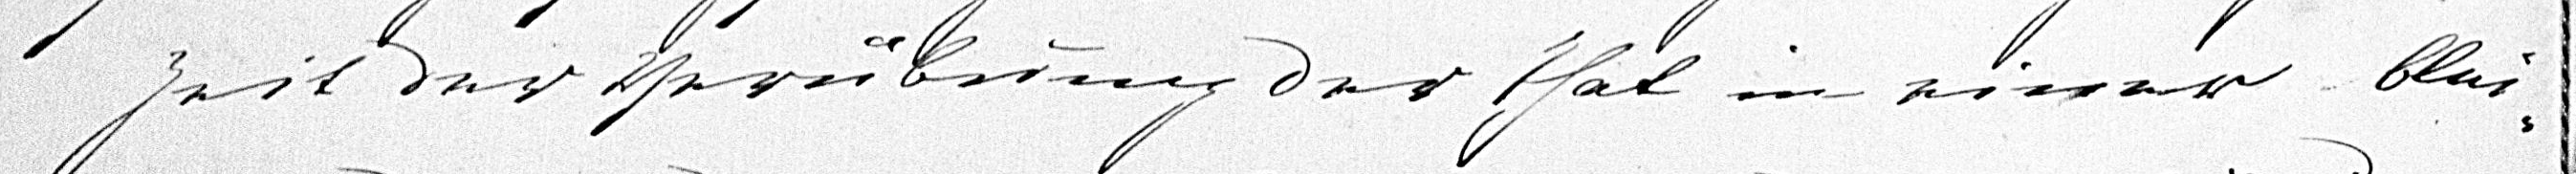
Zeit der Verübung der That in einer blei¬
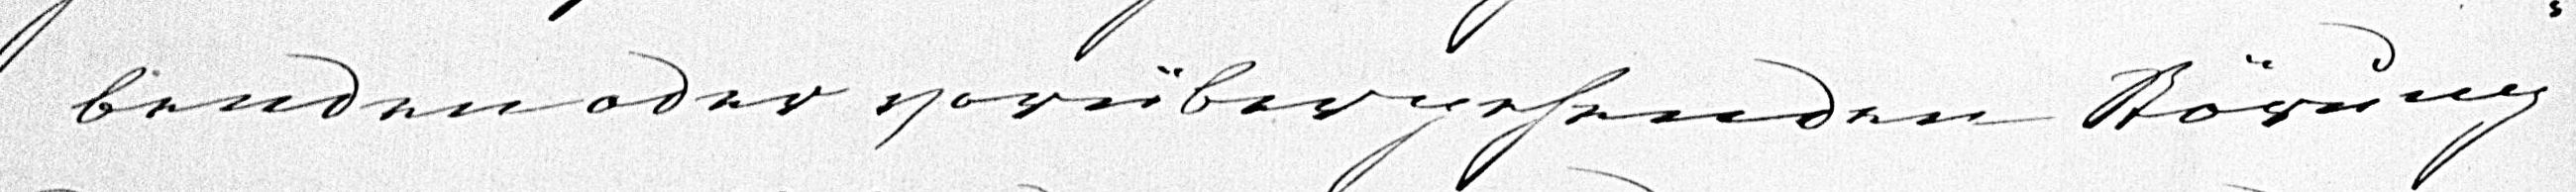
ben oder vorübergehenden Störung
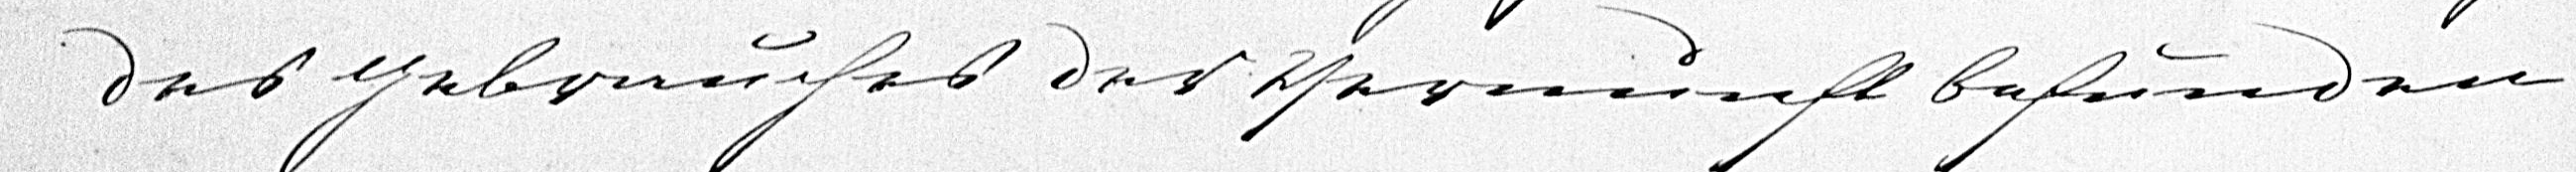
des Gebrauches der Vernunft befunden
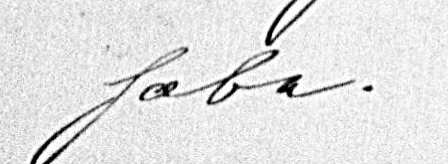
habe.
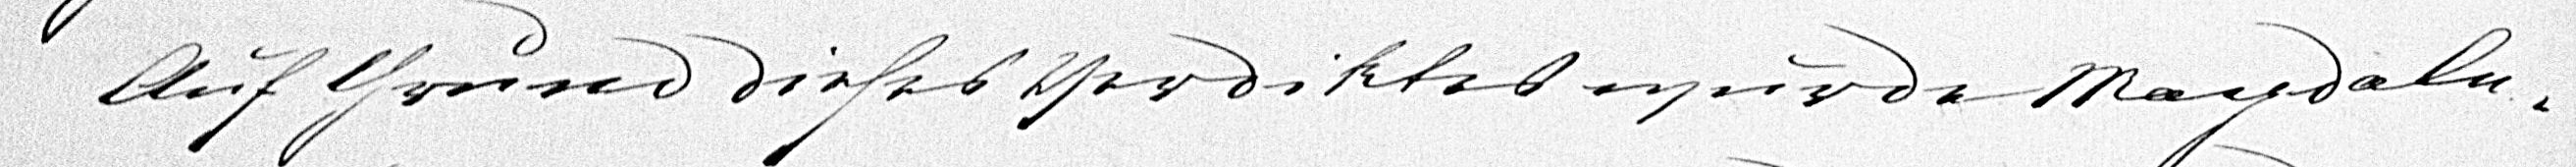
Auf Grund dieses Verdiktes wurde Magdale¬
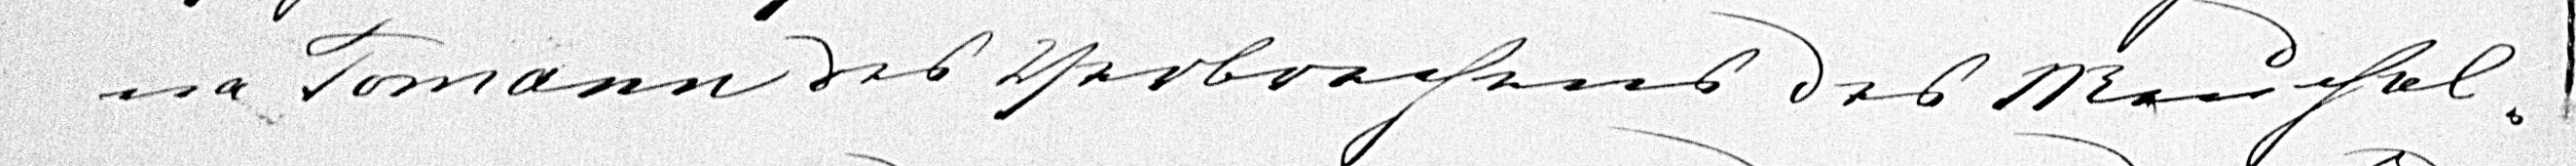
na Tomann des Verbrechens des Meuchel¬
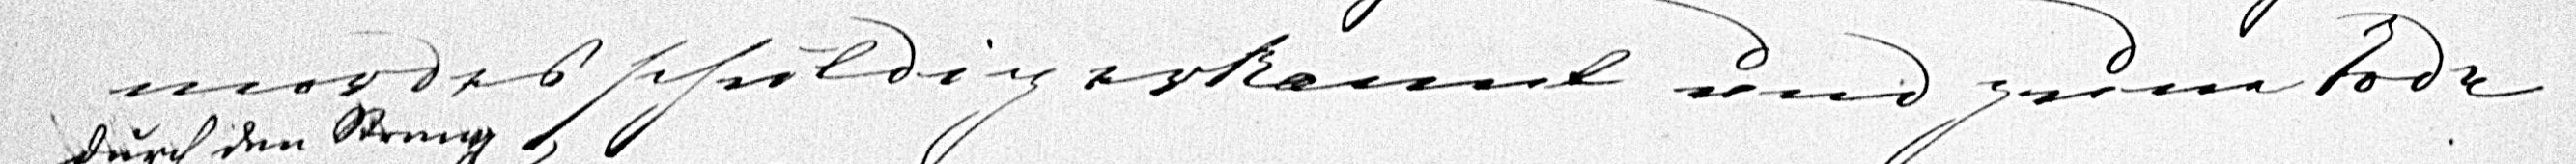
mordes schuldig erkannt und zum Tode
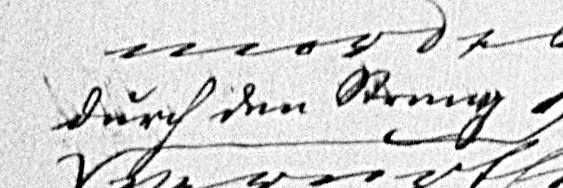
durch den Strang
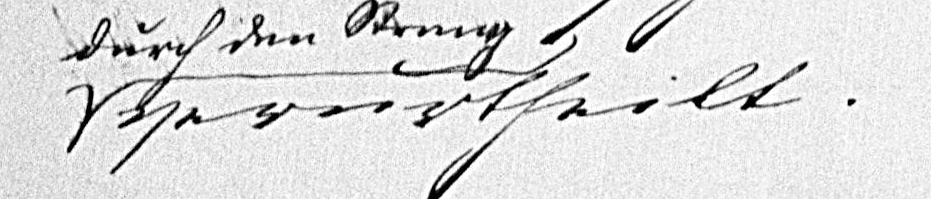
verurtheilt.
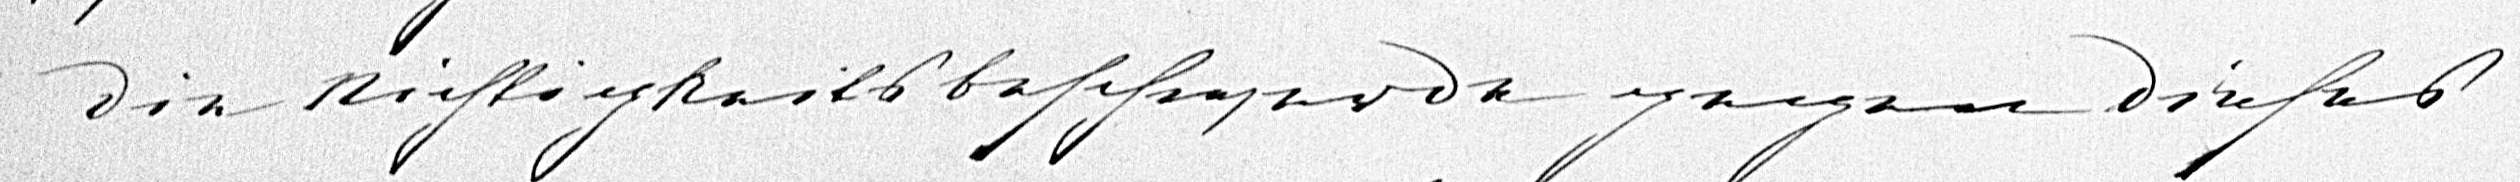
Die Nichtigkeitsbeschwerde gegen dieses
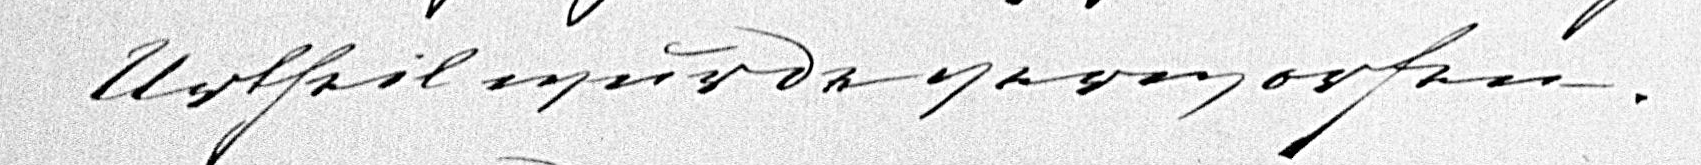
Urtheil wurde verworfen.
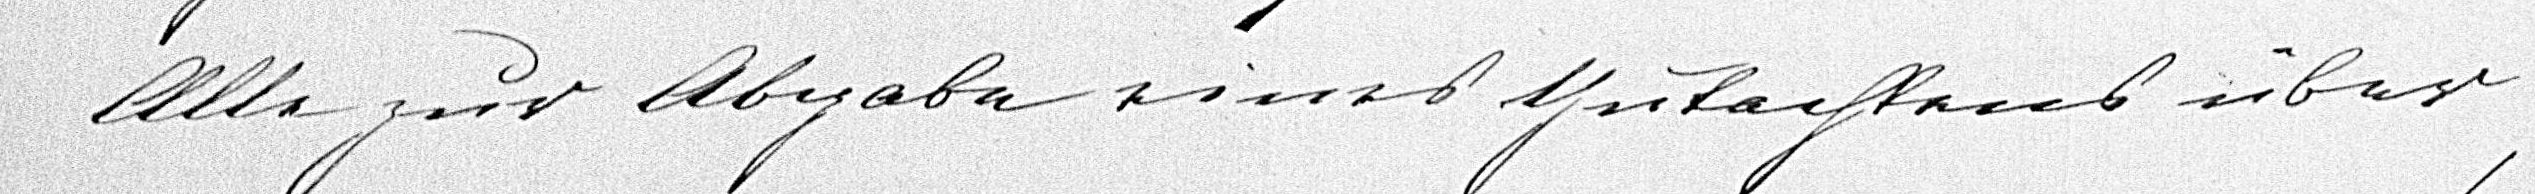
Alle zur Abgabe eines Gutachtens über
